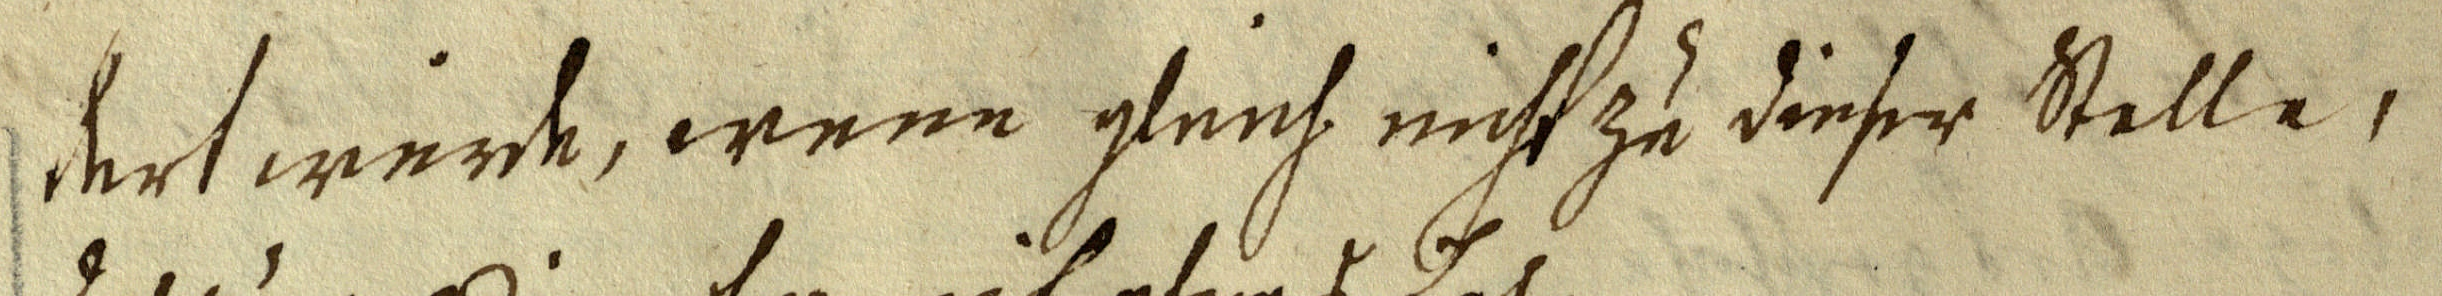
dert würde, wenn gleich nicht zu dieser Stelle,
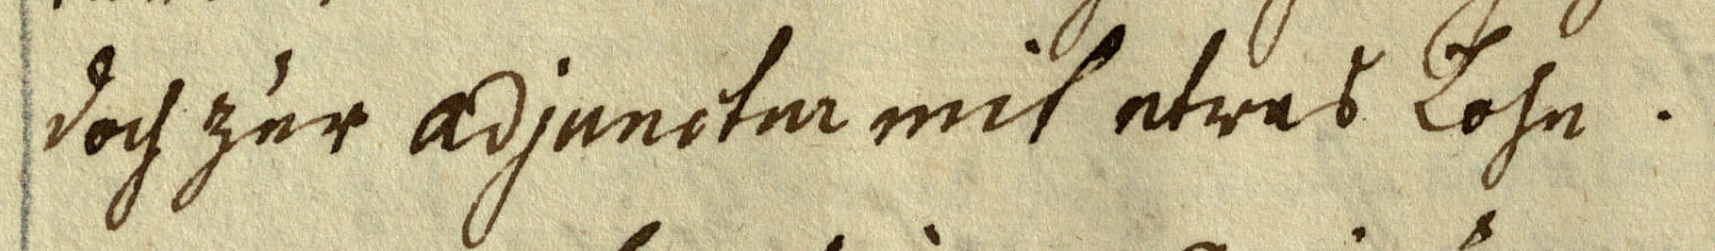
doch zur Adjunctur mit etwas Lohn.
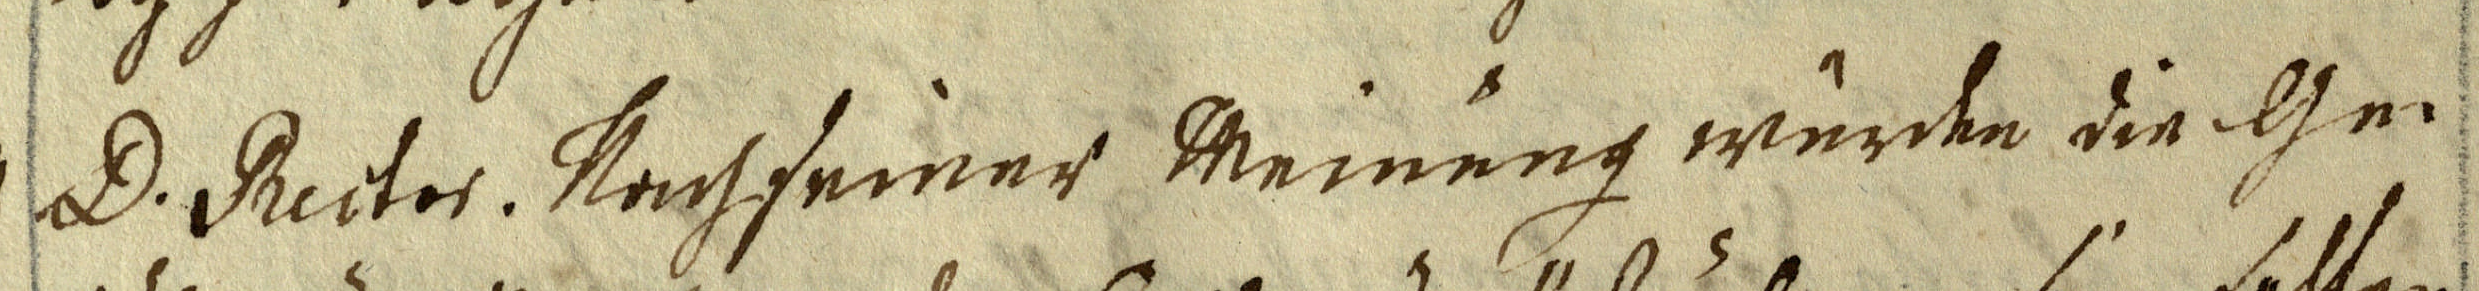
M. D. Rector. Nach seiner Meinung würden die Ge¬
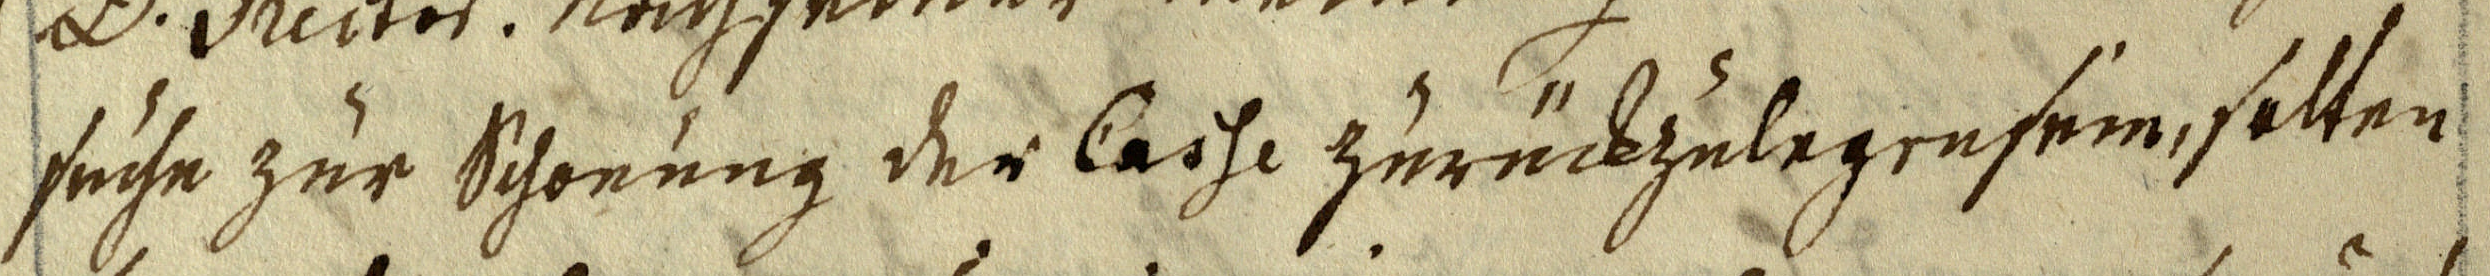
suche zur Schonung der Casse zurückzulegen sein, solten
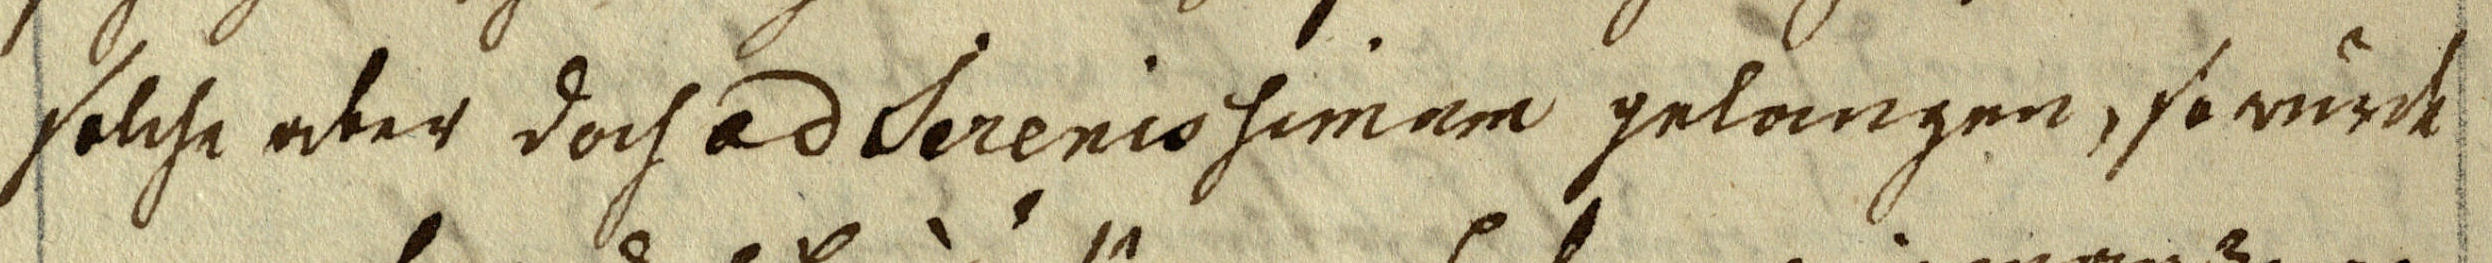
solche aber doch ad Serenissimum gelange, so würde
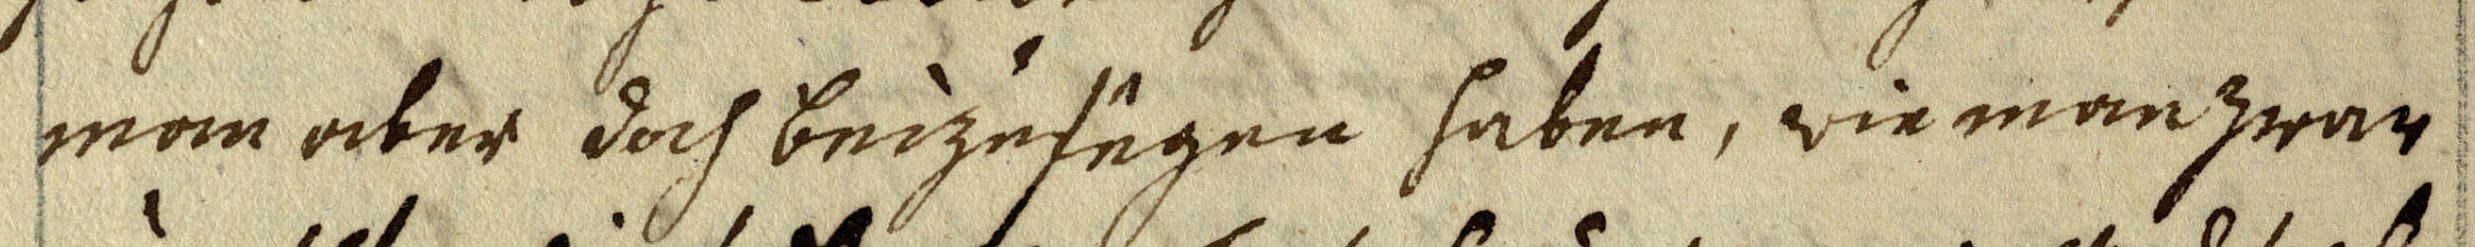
man aber doch beizufügen haben, wie man zwar
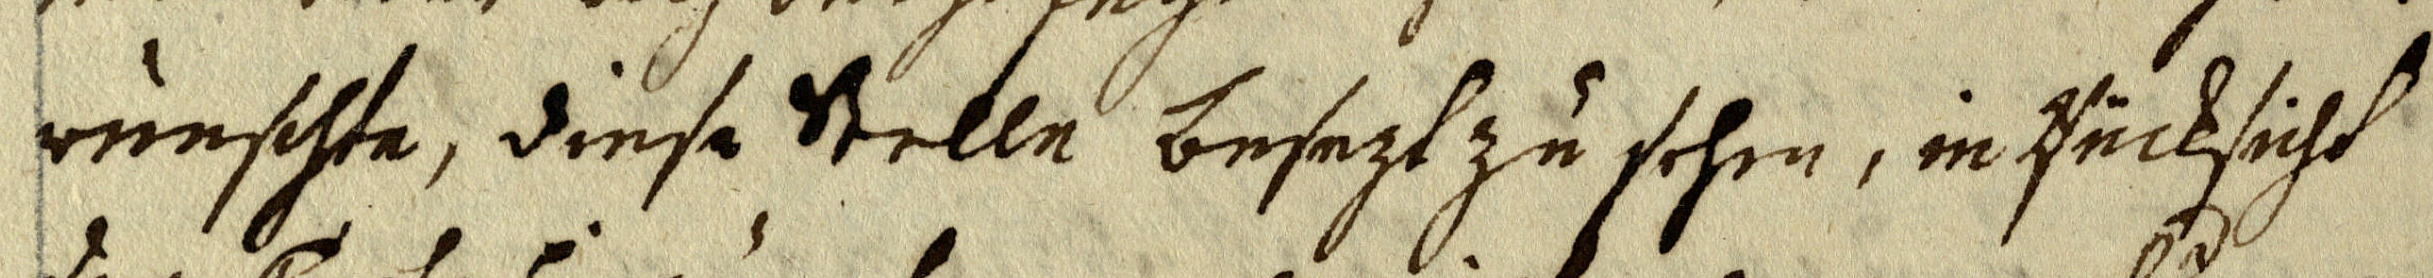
wünschte, diese Stelle besezt zu sehen, in Rücksicht
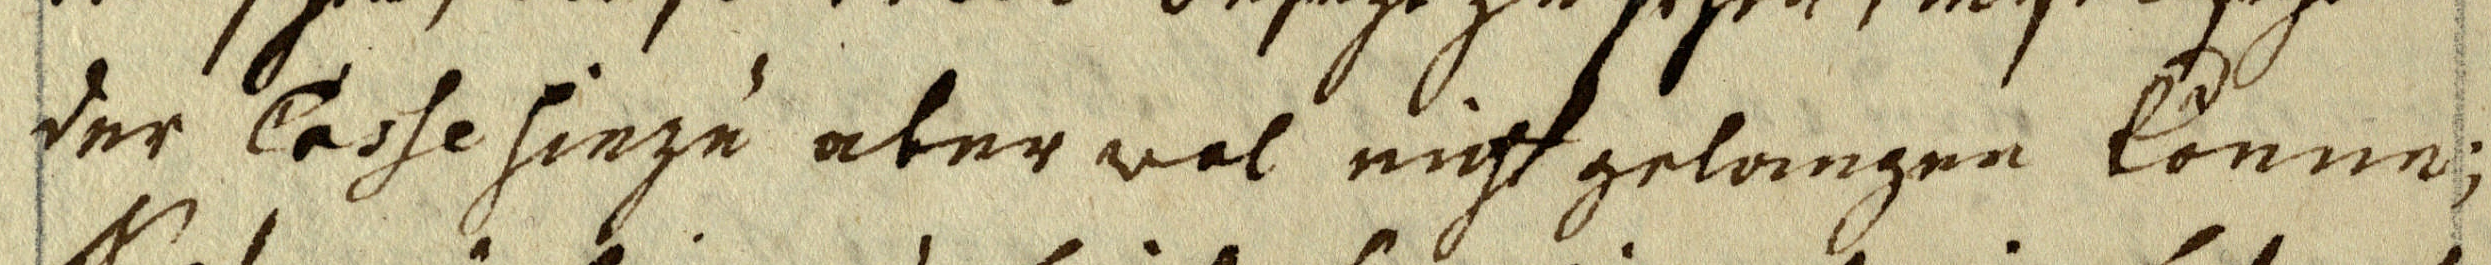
der Casse hiezu aber wol nicht gelangen könne;
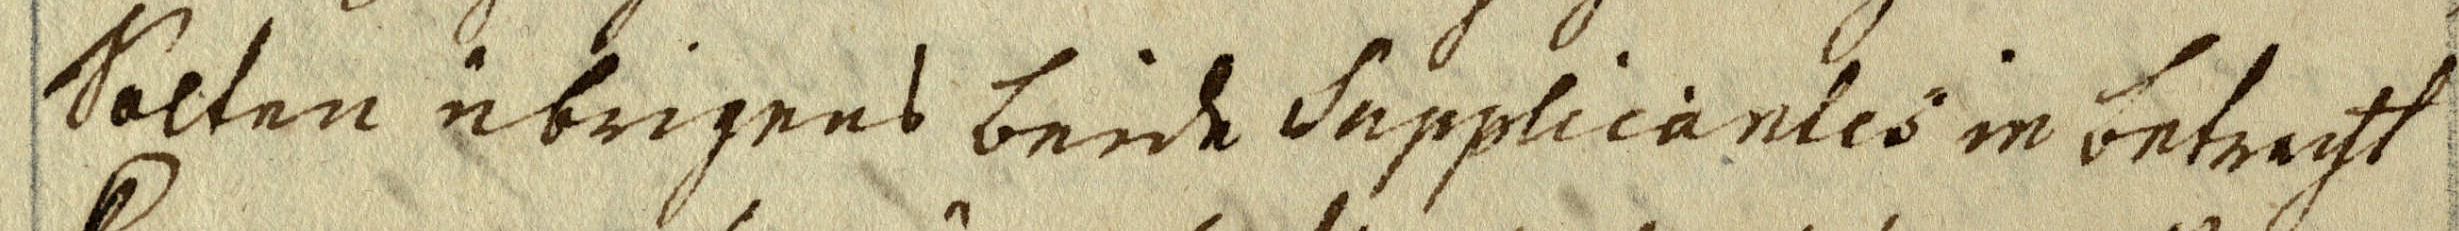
Solten übrigens beide Supplicantes in Betracht
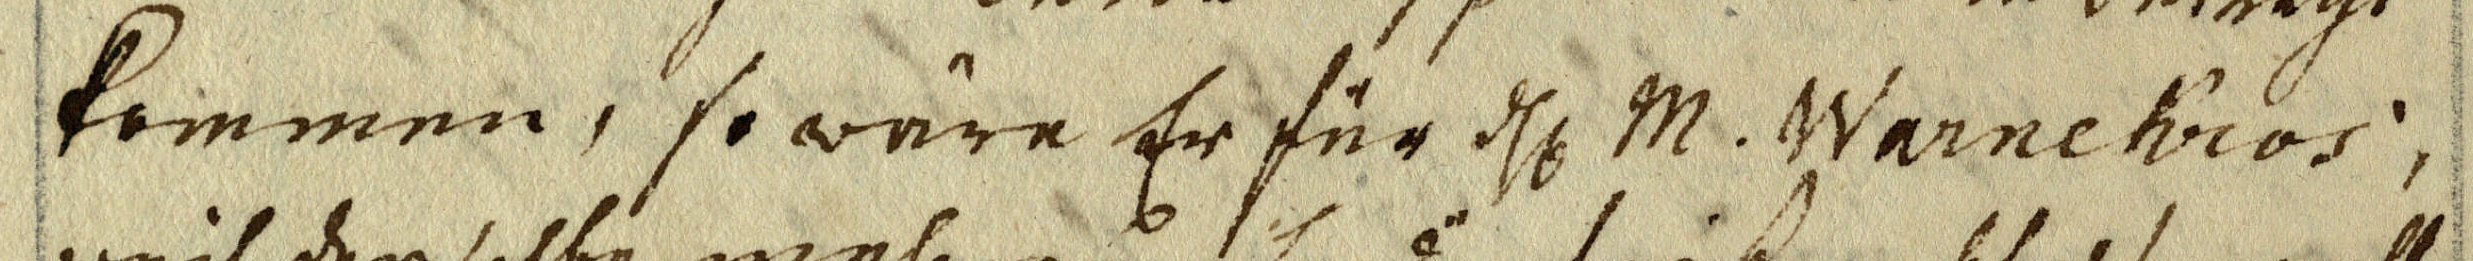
kommen, so wäre Er für dh M. Warnekros,
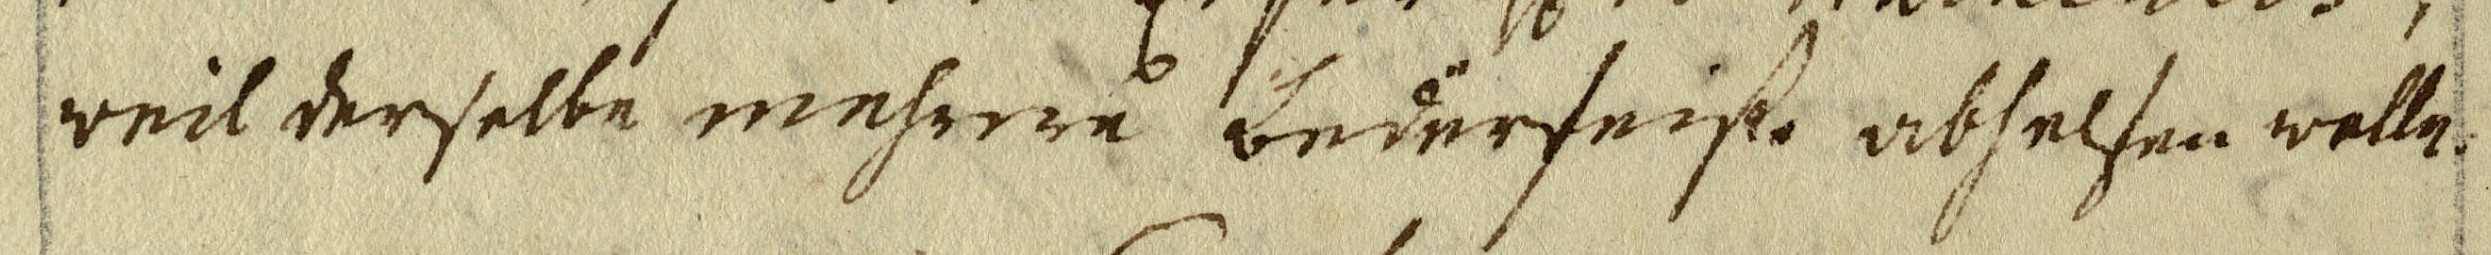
weil derselbe mehrere Bedürfnisse abhelfen wolle.
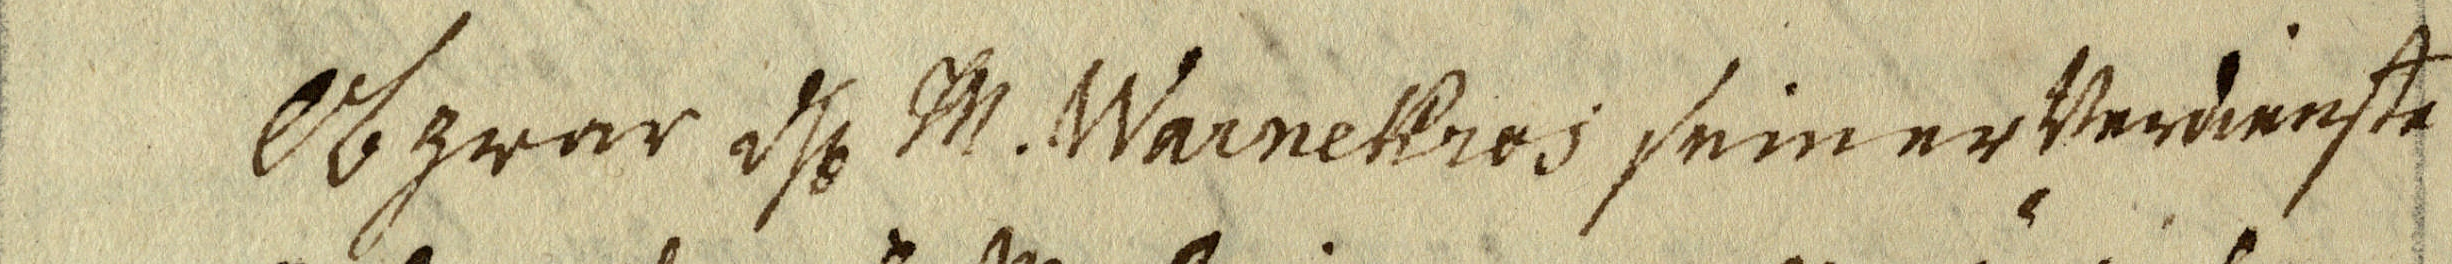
Obzwar dh M. Warnekros seiner Verdienste
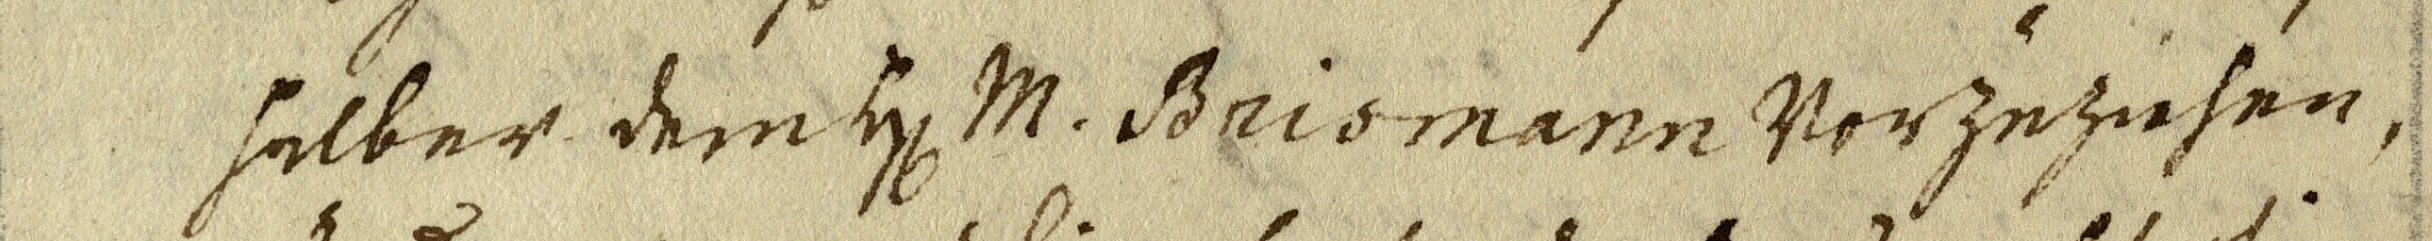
halber dem h. M. Brismann vorzuziehen,
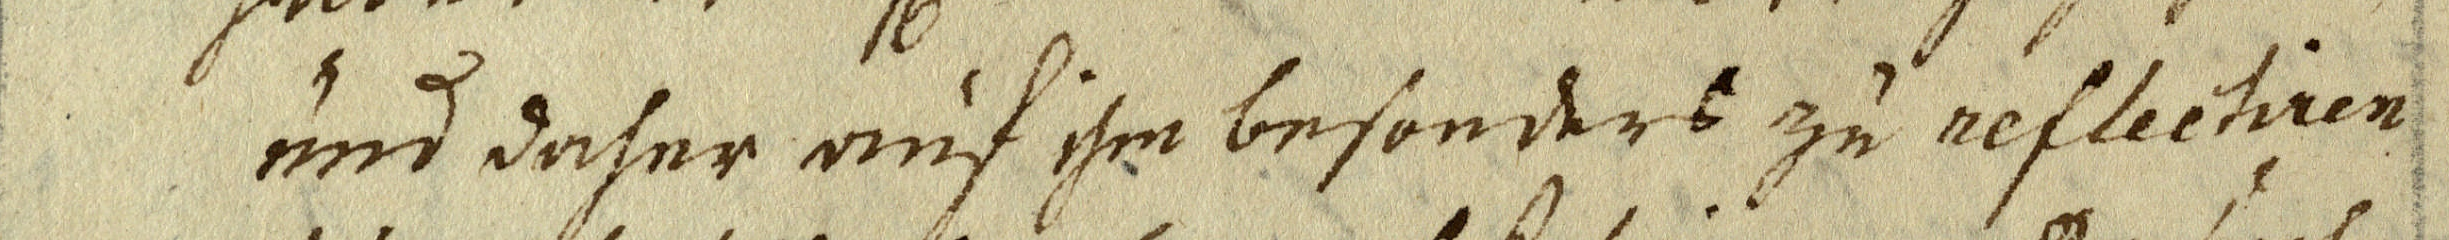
und daher auf ihm besonders zu reflectiren
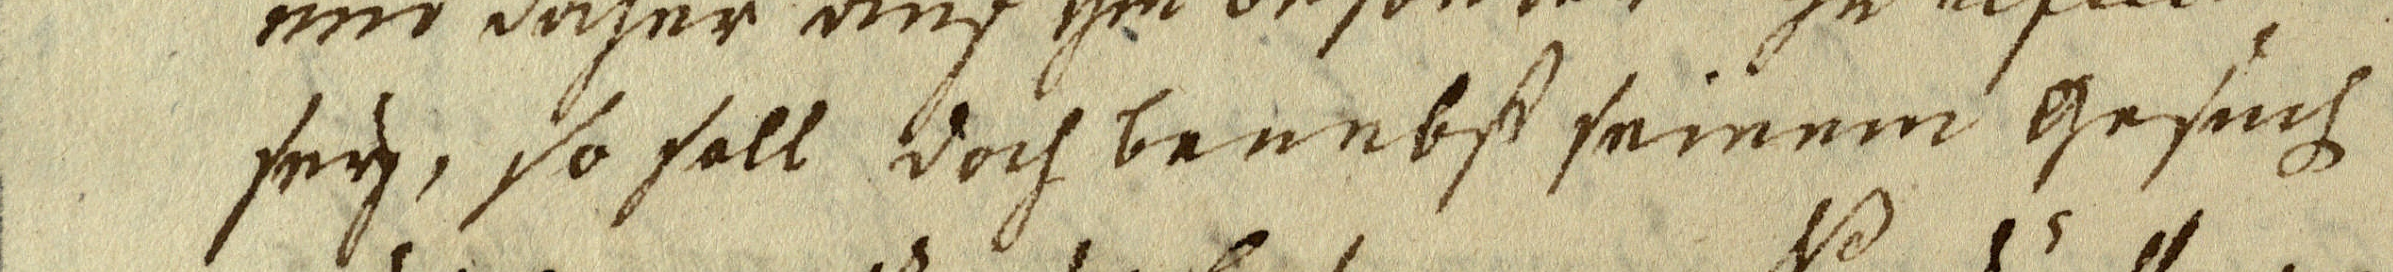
seÿ, so soll doch benebst seinem Gesuch
